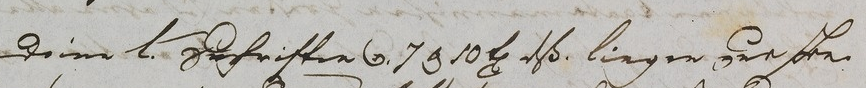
Deine l. Zuschriftenv. 7 & 10ten dß. liegen zur Be-
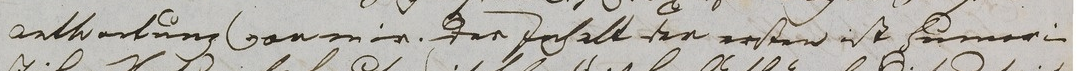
antwortung vor mir. Der Inhalt der ersten ist humori-
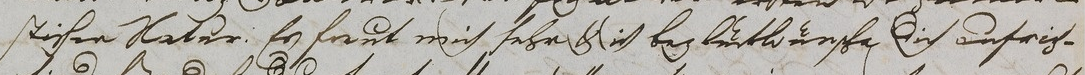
stischer Natur. Es freut mich sehr & ich beglückwünsche Dich aufrich-
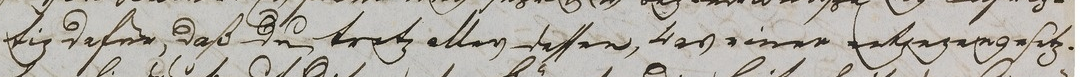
tig dafür, daß Du trotz alles dessen, was einen entgegengesetz-
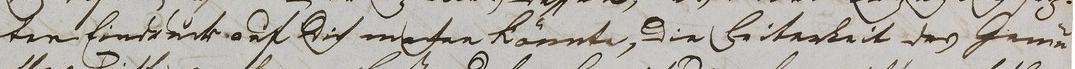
ten Eindruck auf Dich machen könnte, die Heiterkeit des Gemü-
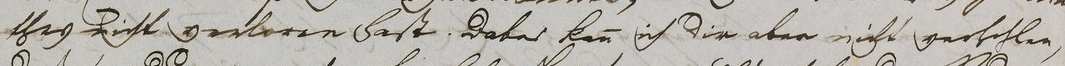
thes nicht verloren hast. Dabei kann ich Dir aber nicht verhehlen,
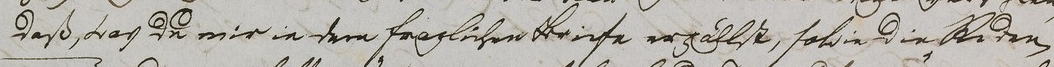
daß, was Du mir in dem fraglichen Briefe erzählst, sowie die «Reden,
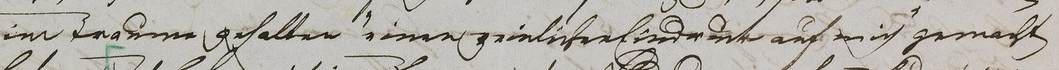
im Traume gehalten» einen peinlichen Eindruck auf mich gemacht
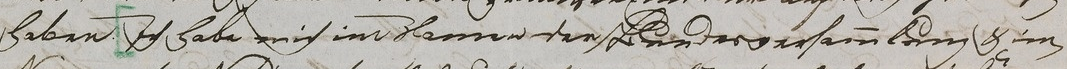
haben. Ich habe mich im Namen der Bundesversammlung & im
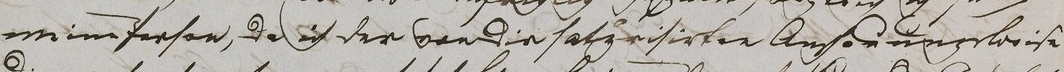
meine Person, da ich der von Dir satyrisirten Anschauungsweise
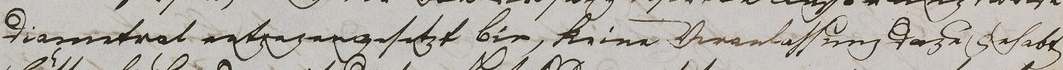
diametral entgegengesetzt bin, keine Veranlassung dazu gehabt
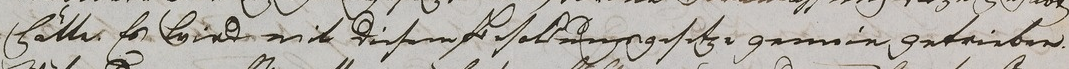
hätte. Es wird mit diesem Besoldungsgesetze gemein getrieben.
